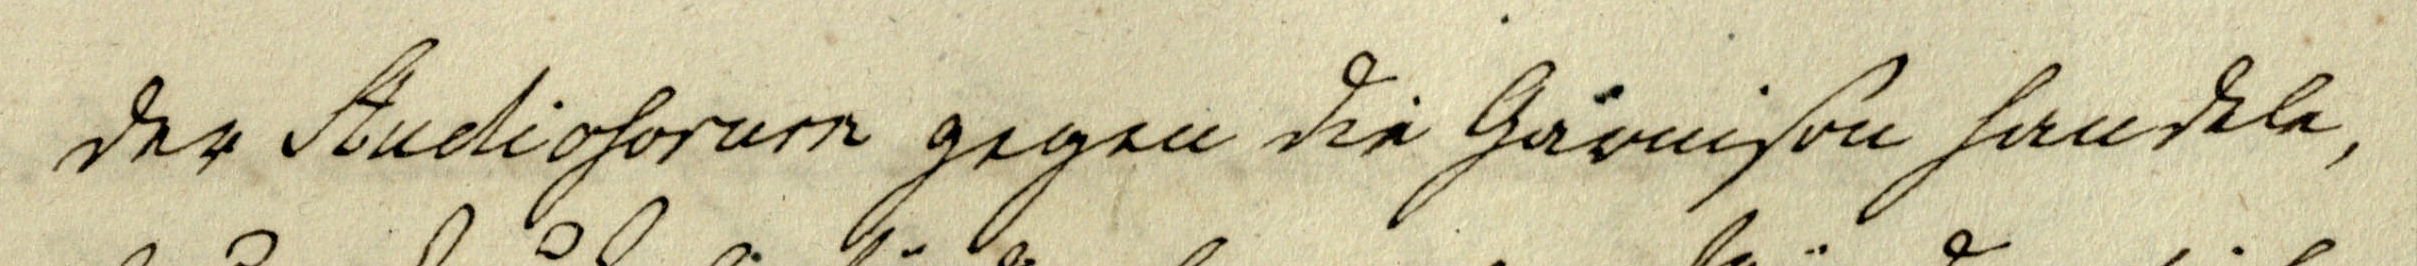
der Studiosorum gegen die Garnison handele,
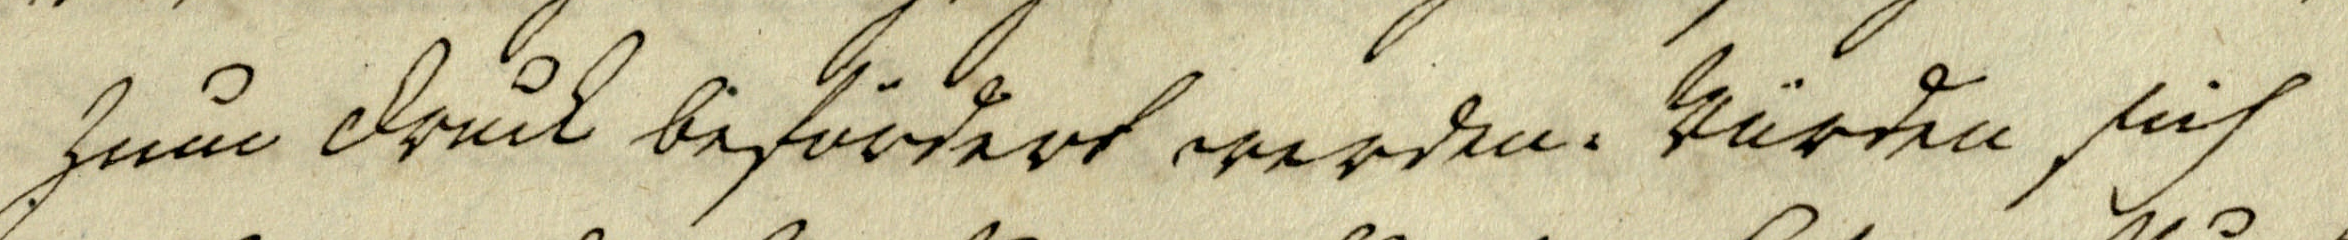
zum Druck befördert werden. Würden sich
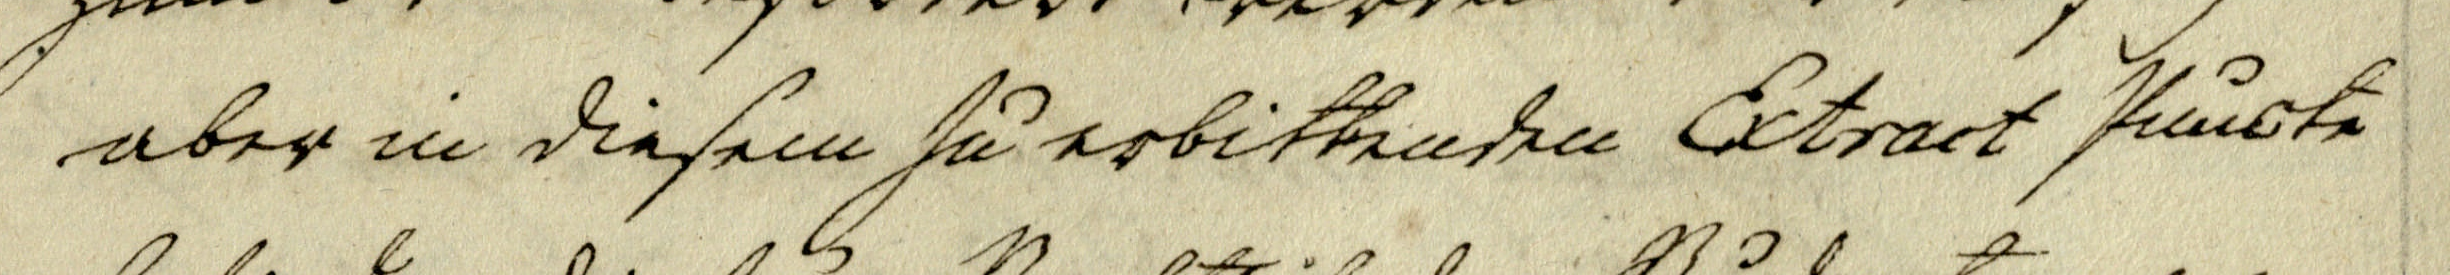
aber in diesem zu erbittenden Extract Puncte
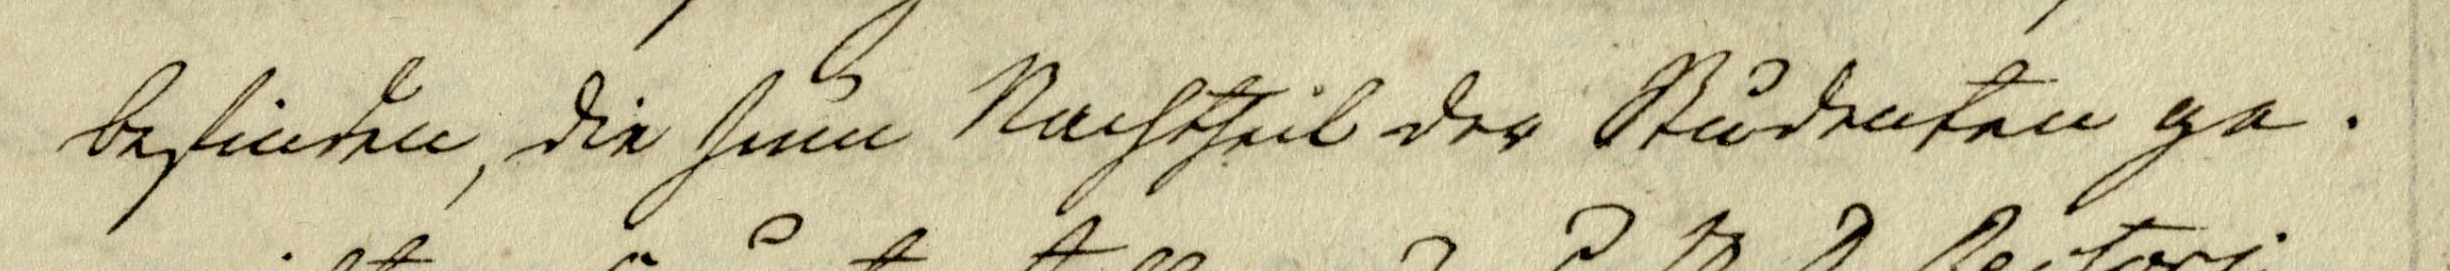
befinden, die zum Nachtheil der Studenten ge¬
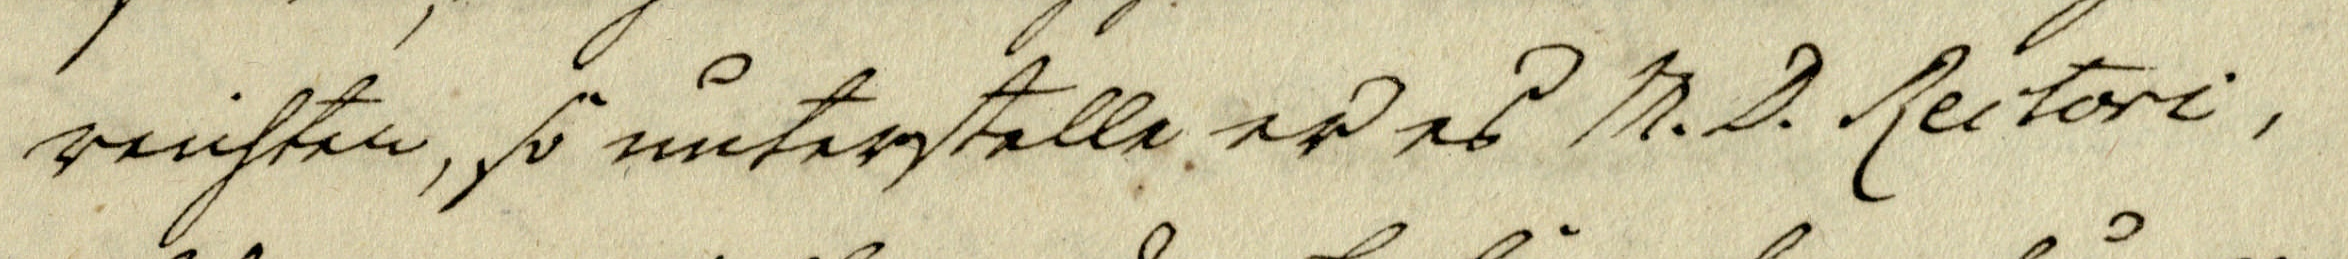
reichten, so unterstelle er es M. D. Rectori,
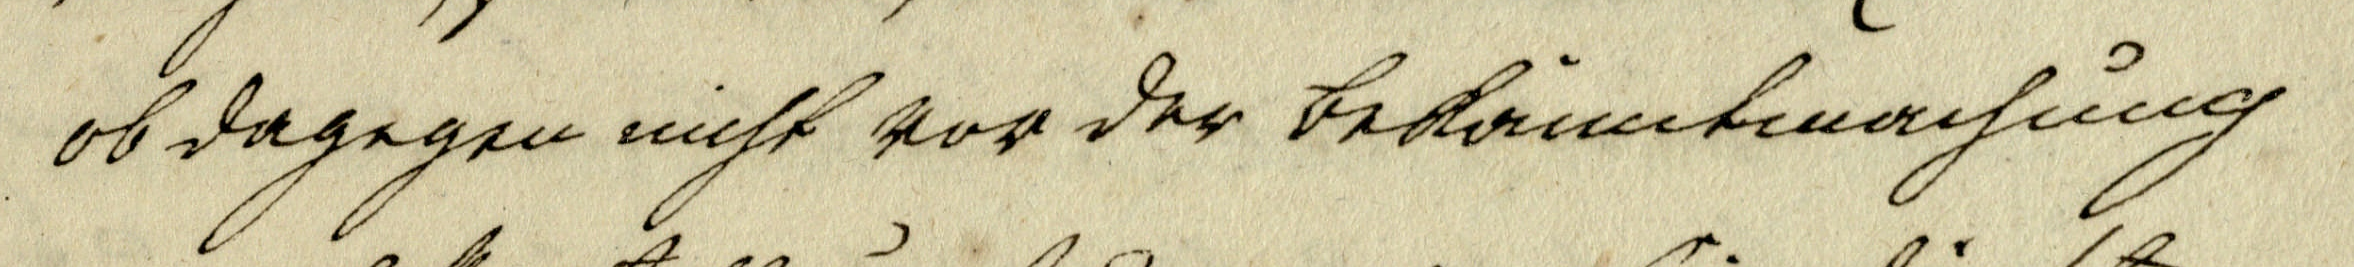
ob dagegen nicht vor der Bekanntmachung
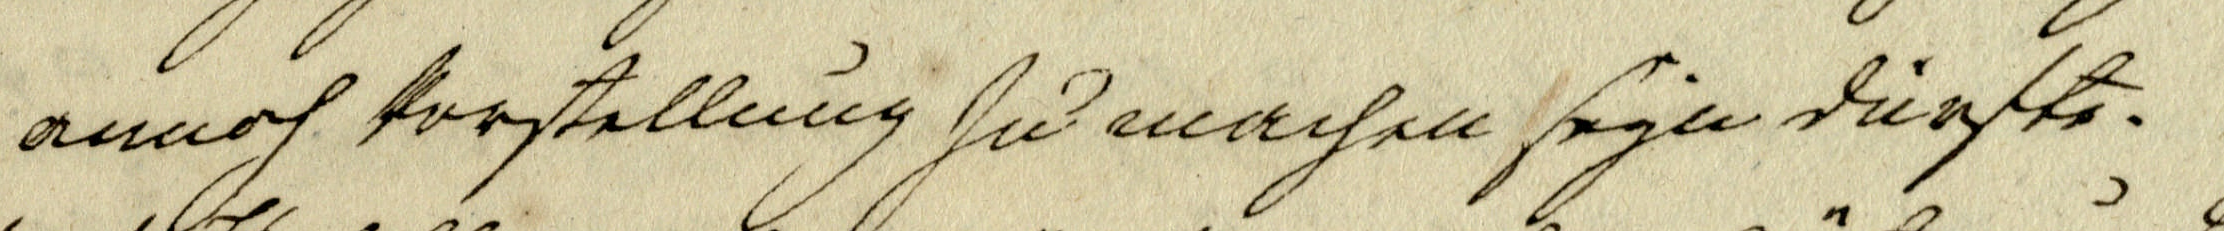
annoch Vorstellung zu machen seÿn dürfte.
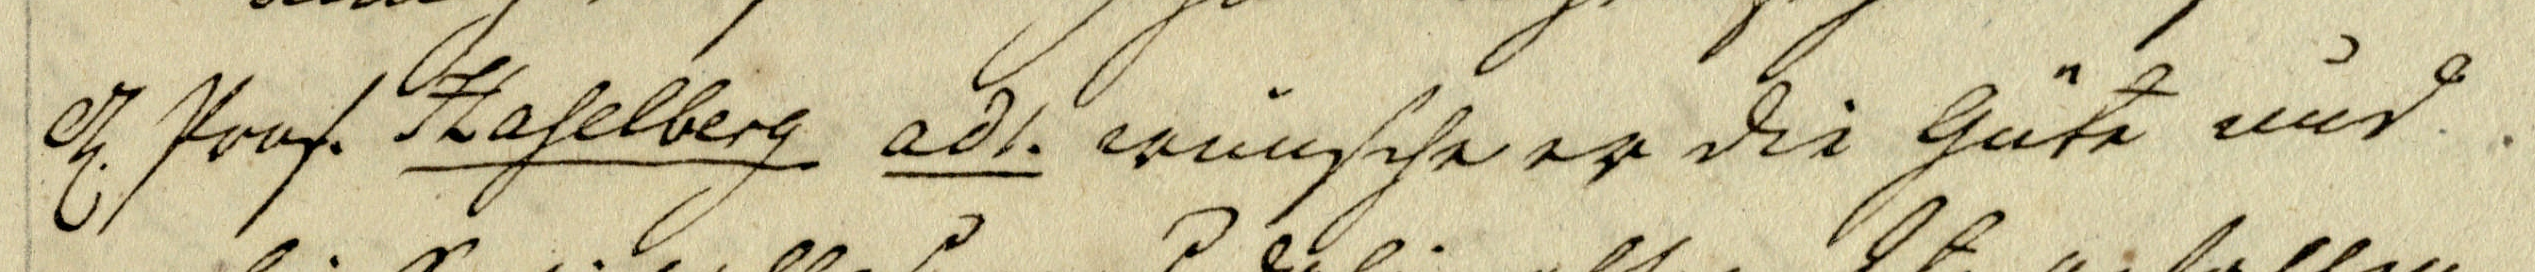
dh. Prof. Haselberg ad 1. wünsche er die Güte und
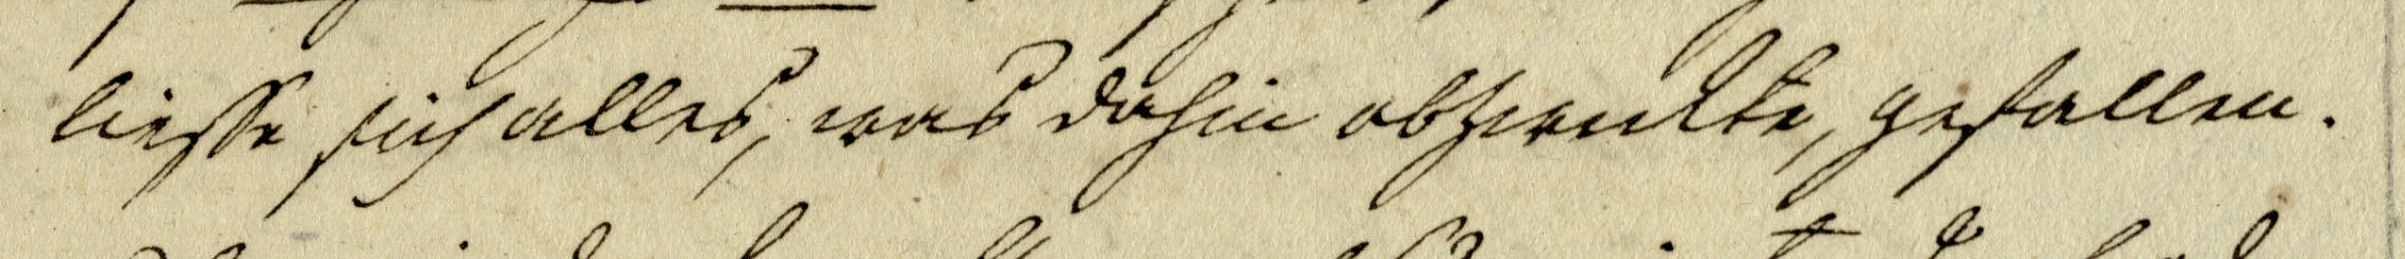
liesse sich alles, was dahin abzweckte, gefallen.
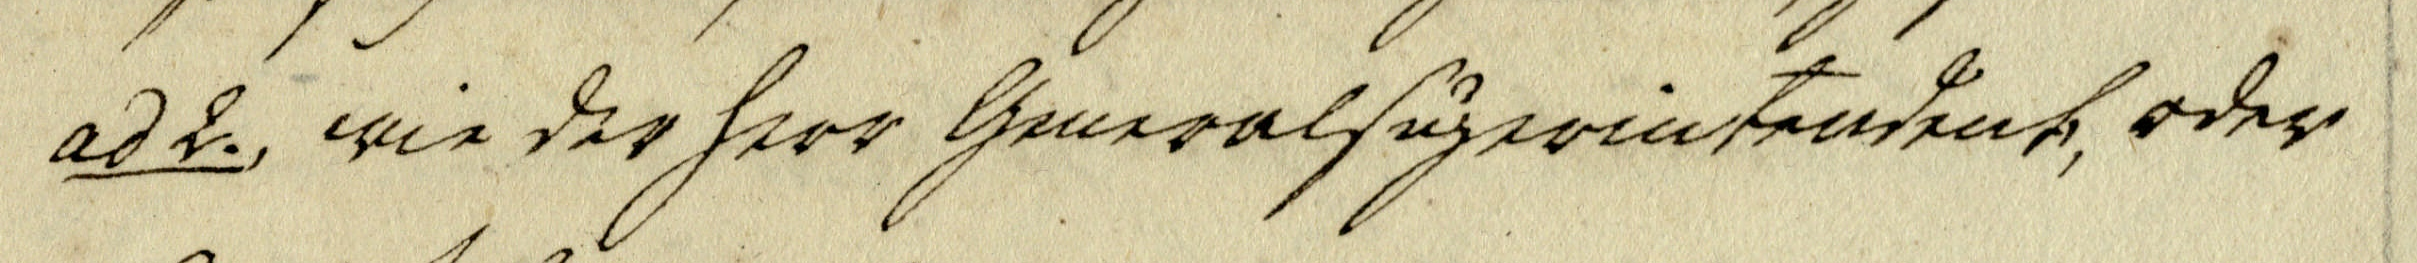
ad 2., wie der Herr Generalsuperintendent, oder
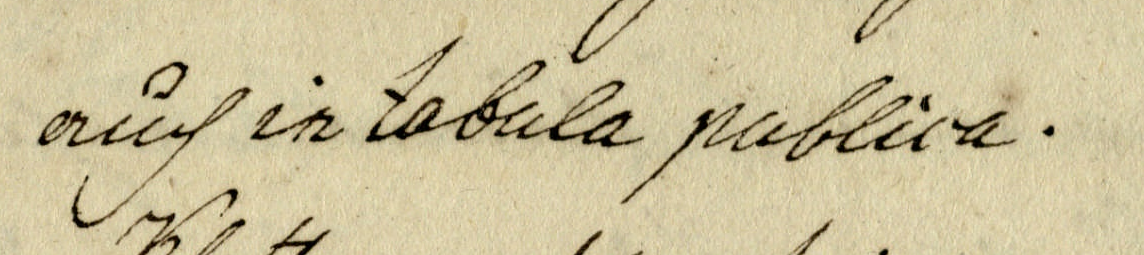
auch intabula publica.
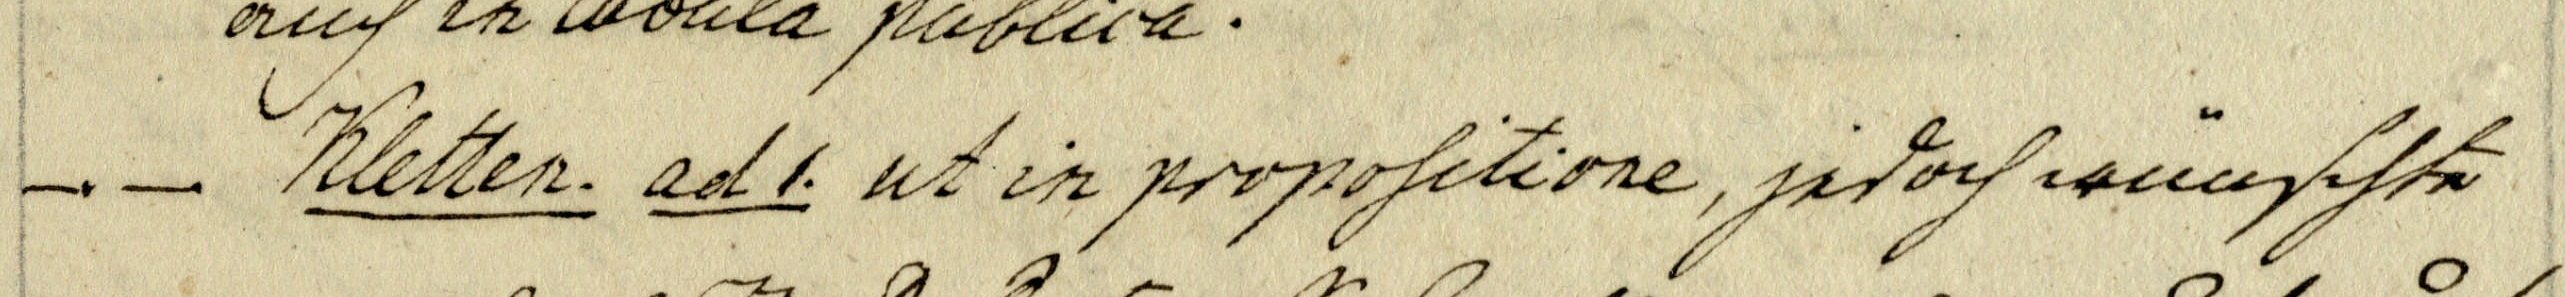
Kletten. ad 1. ut in propositione, jedoch wünschte
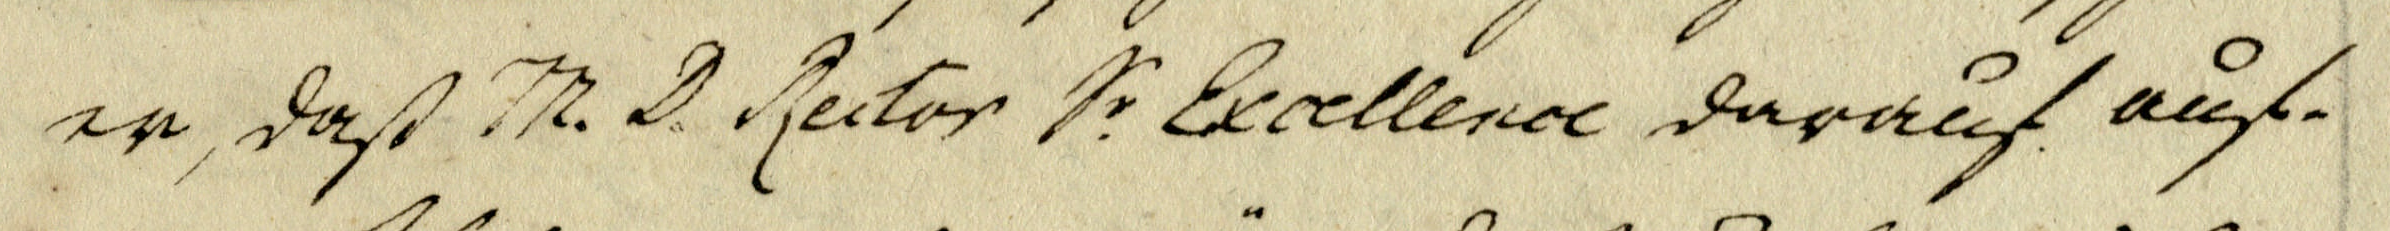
er, daß M. D. Rector Sr Excellence darauf auf¬
